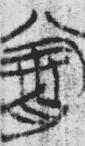○（遯）
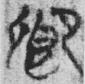卿（亨）
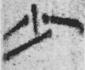少（小）
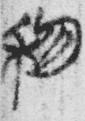利
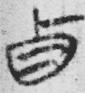貞
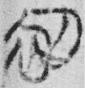初
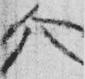六
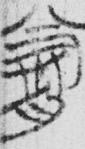○（遯）
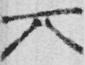亓（其）
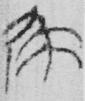尾
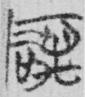○（厲）
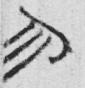勿
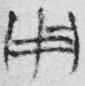用
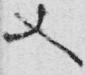又（有）
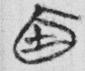○（攸）
